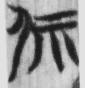𫵖
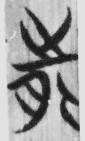之月
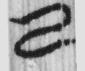己
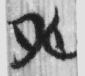卯
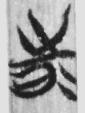之日
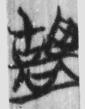○（盬）
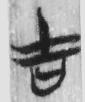吉
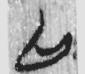㠯（以）
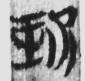○（保）
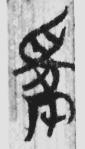○（家）
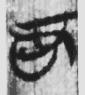爲
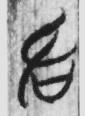左
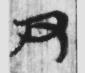尹
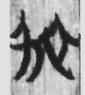{力它}
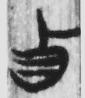貞
